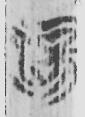湯
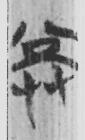{网廾}
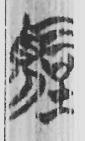{馬呈}
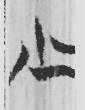少
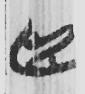臣
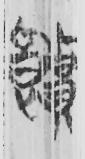饋
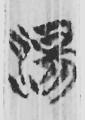湯
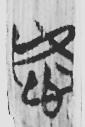㣽
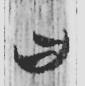曰
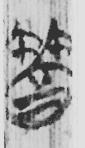䈞
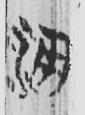洀
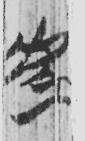𫊟（吾）
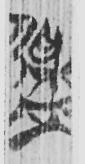{弓采皿}
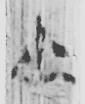少
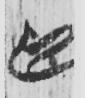臣
